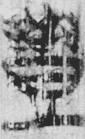豐
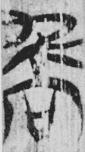喬（鎬）
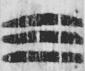三
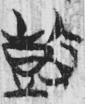○（鼓）
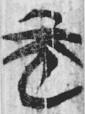而
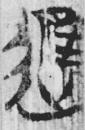進
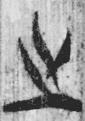之
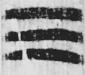三
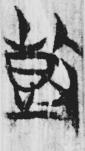○（鼓）
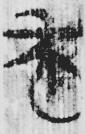而
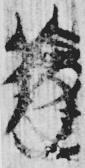退
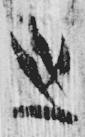之
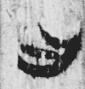曰
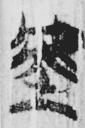○（吾）
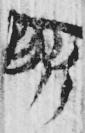所
